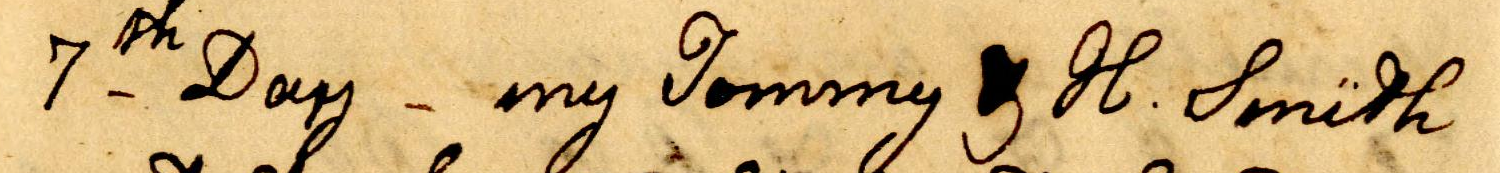7^th Day- my Tommy & H. Smith
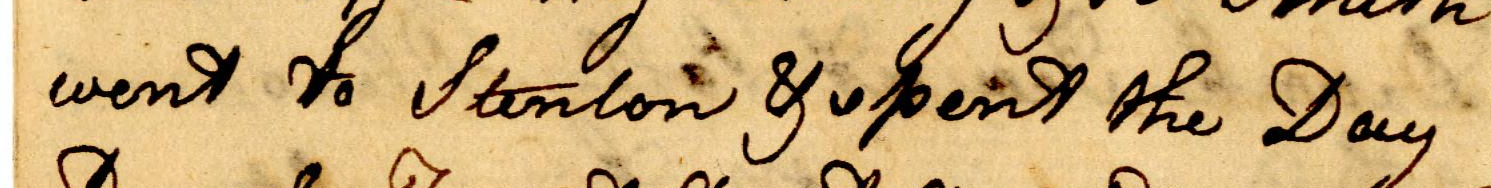went to Stenton & spent the Day
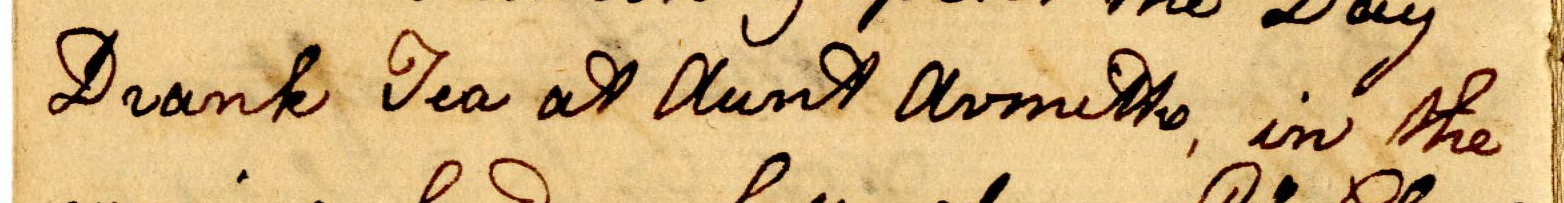Drank Tea at Aunt Armitts, in the
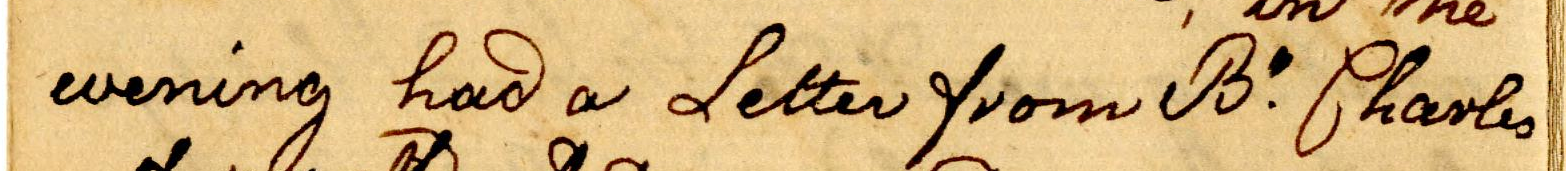evening had a Letter from B^r. Charles
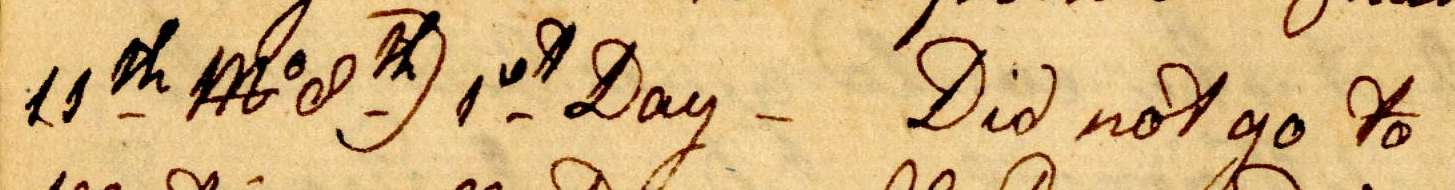11^th M^o 8^th) 1^st Day- Did not go to
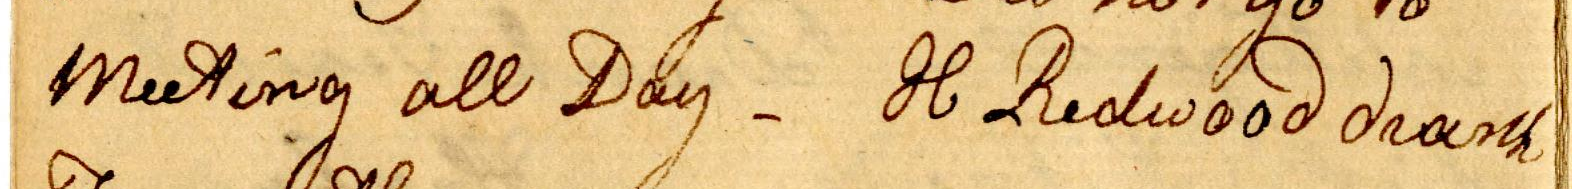Meeting all Day- H Redwood drank
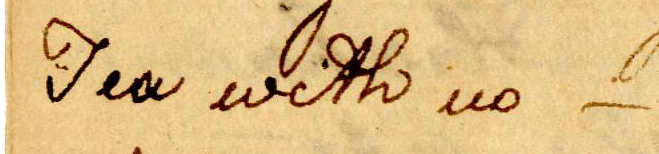Tea with us-
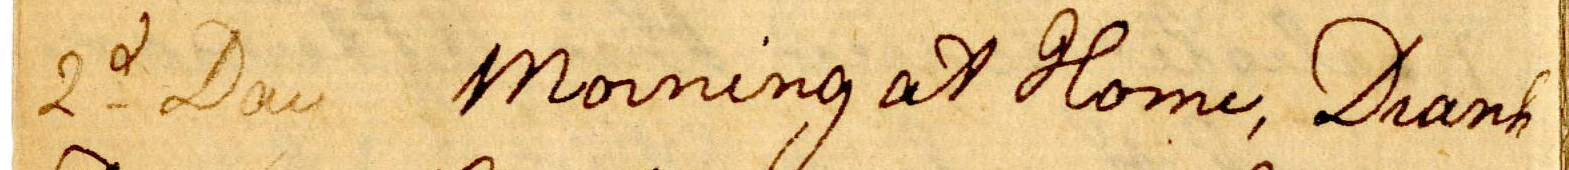2^d. Day- Morning at Home, Drank
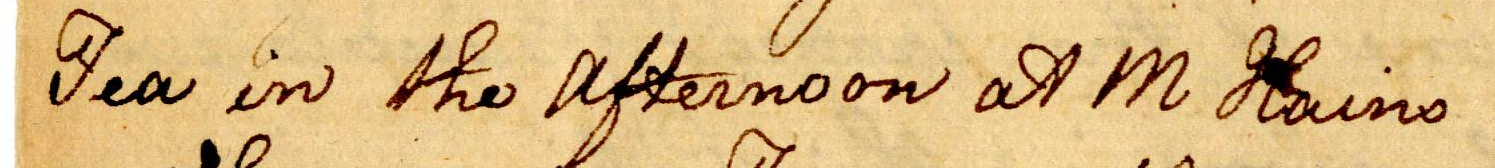Tea in the Afternoon at M Hains
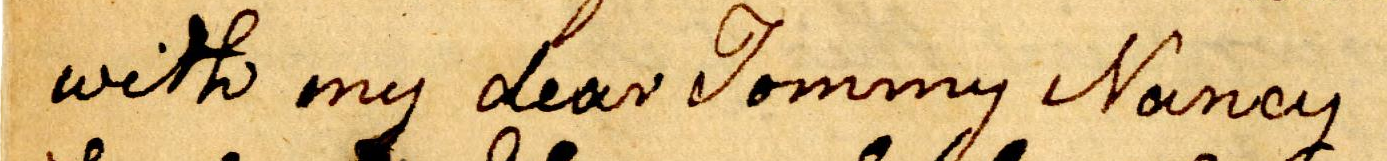with my dear Tommy Nancy
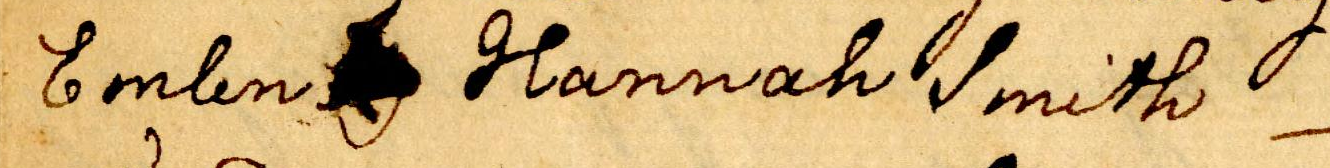Emlen [_] Hannah Smith -
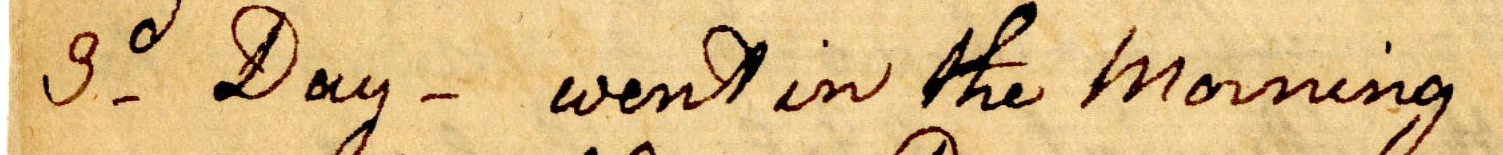3^d. Day- went in the Morning
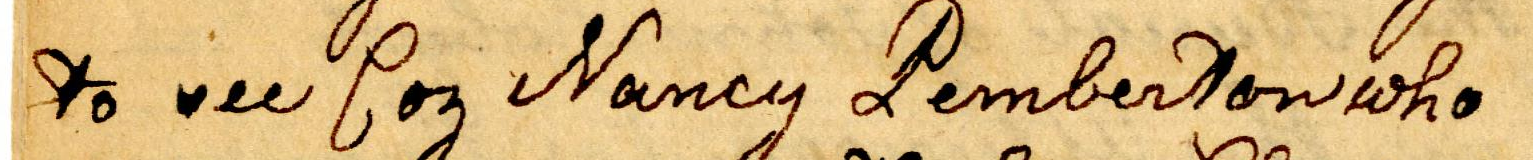to see Coz Nancy Pemberton who
